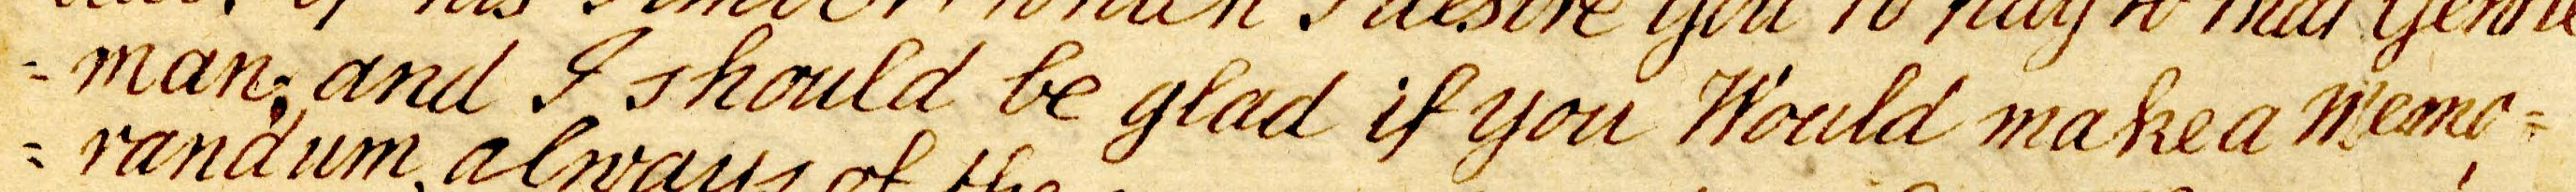-man; and I should be glad if you Would make a Memo-
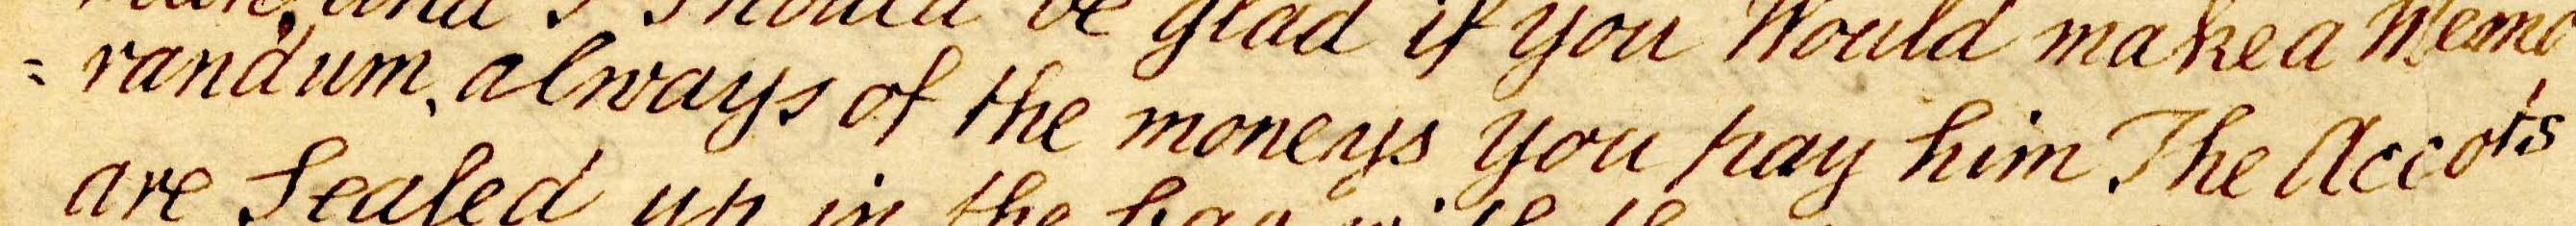-randum, always of the moneys you pay him. The Acco^ts
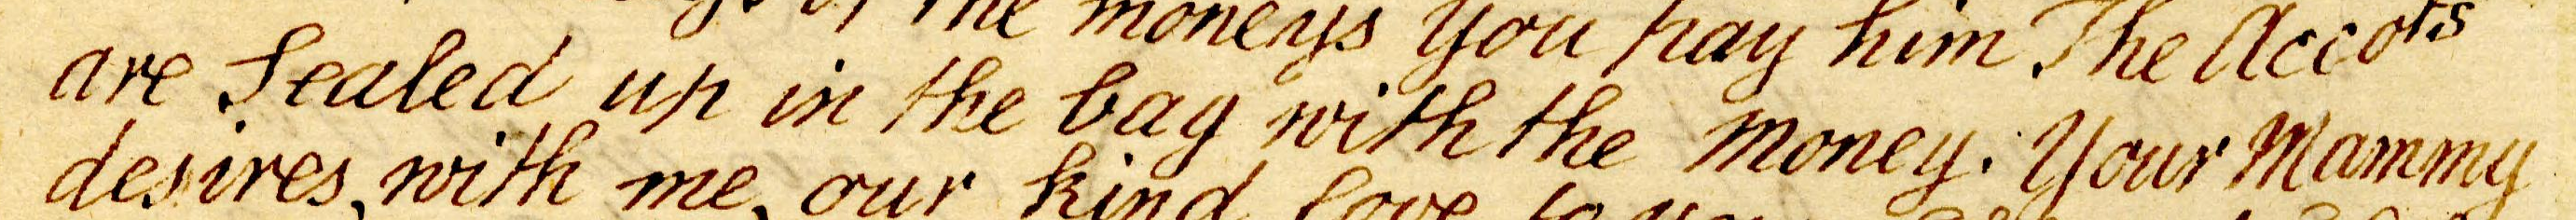are Sealed up in the bag with the Money: Your Mammy
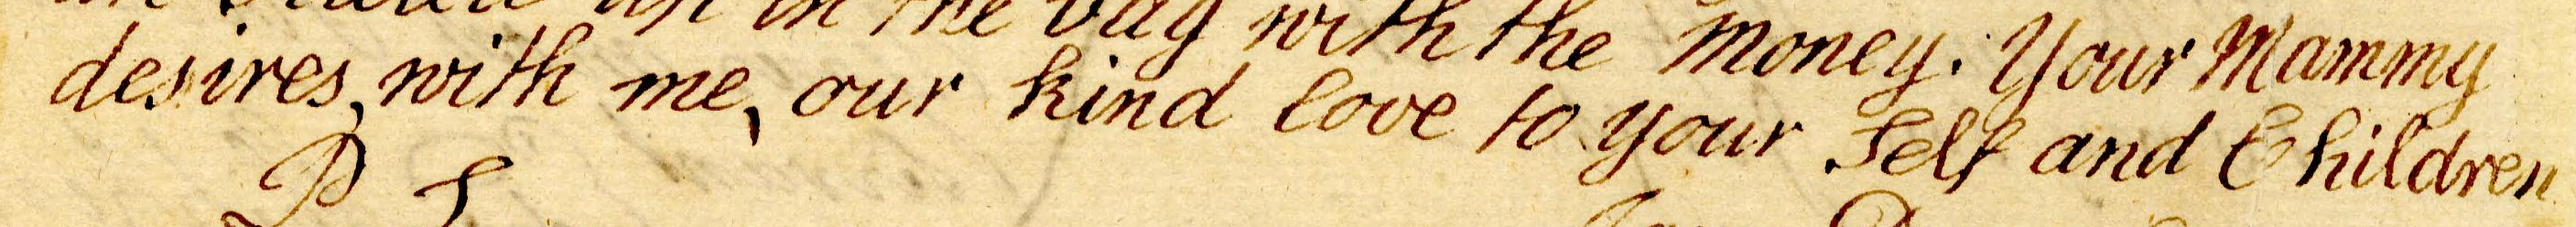desires, with me, our kind love to Your Self and Children
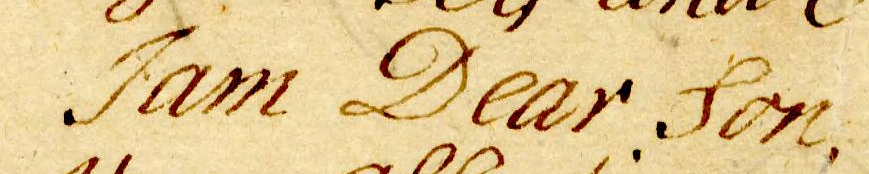I am Dear Son
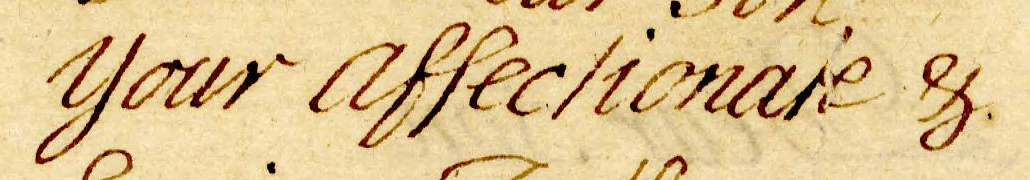Your Affectionate &
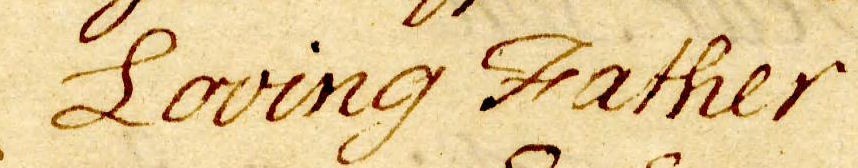Loving Father
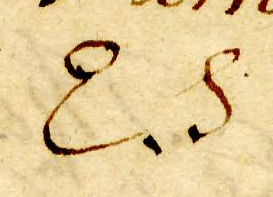E.S
